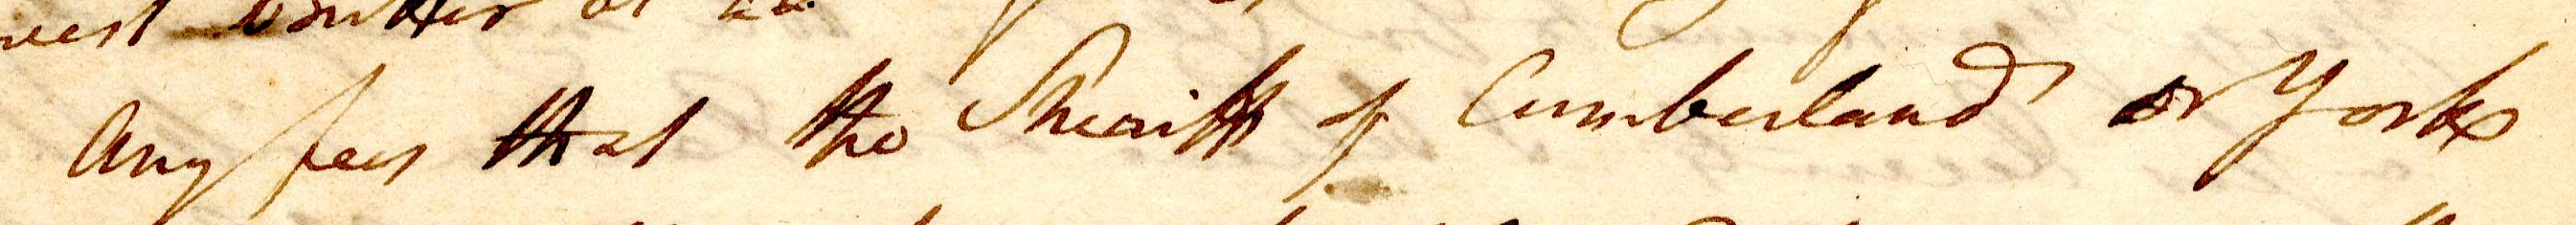Any few that the Sheriff of Cumberland or York
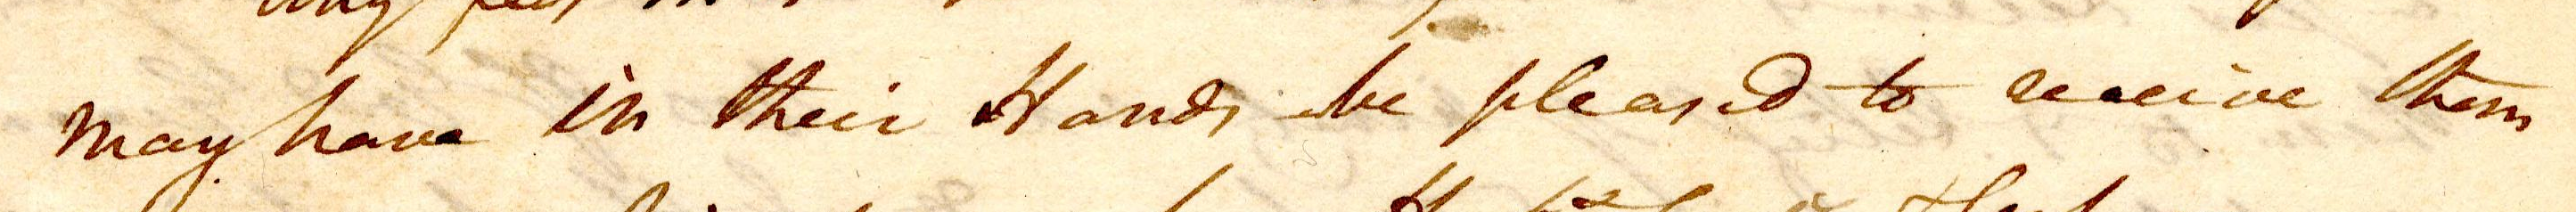may have in their Hands be pleased to receive them
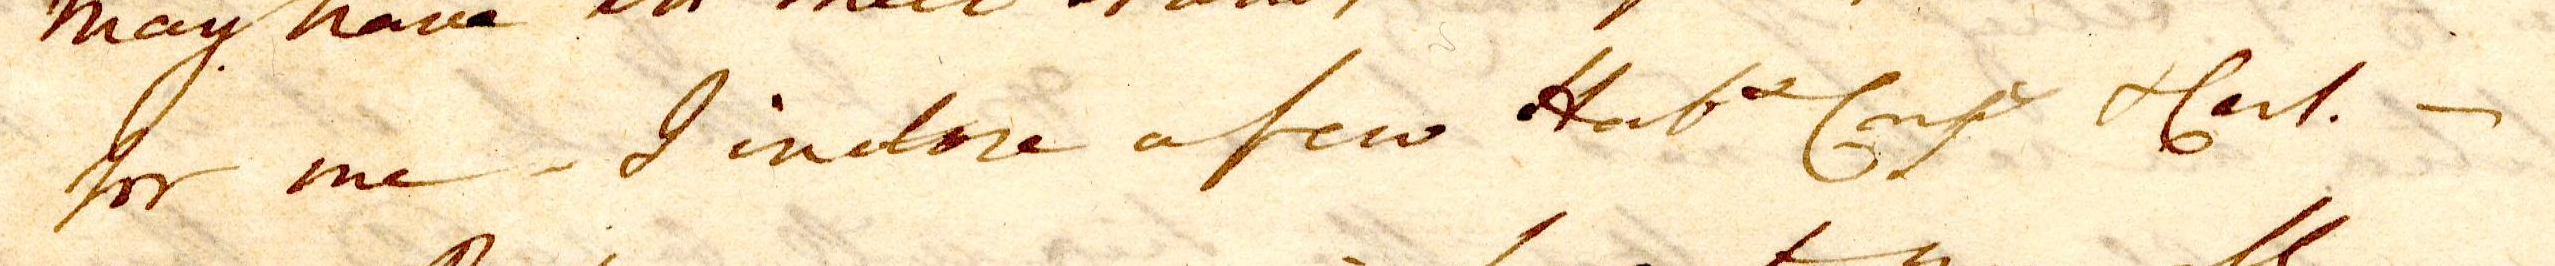tor me. I inclose a few Hab^s Corp^s & Cert
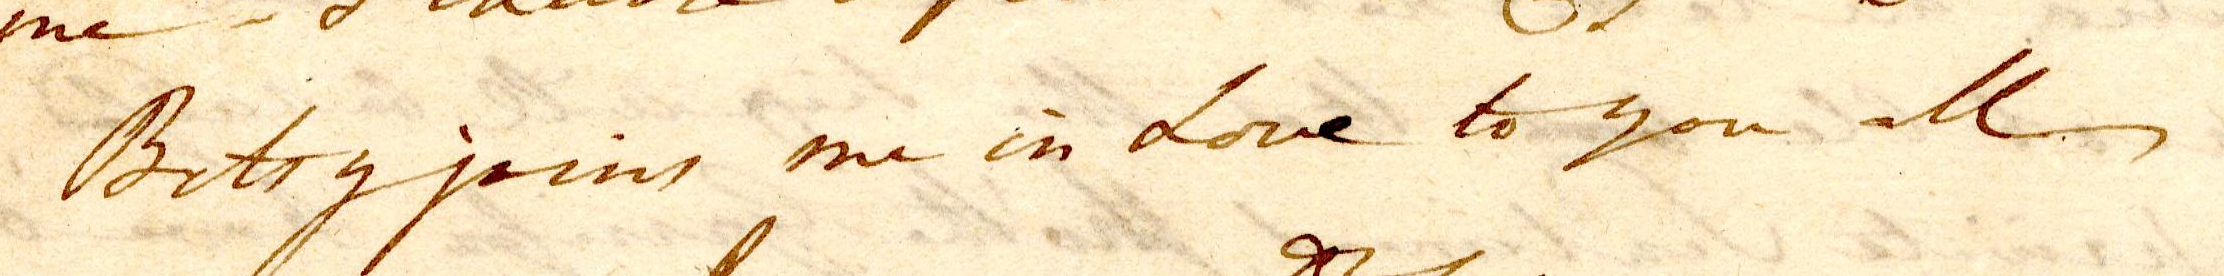Betty joins me in Love to you all
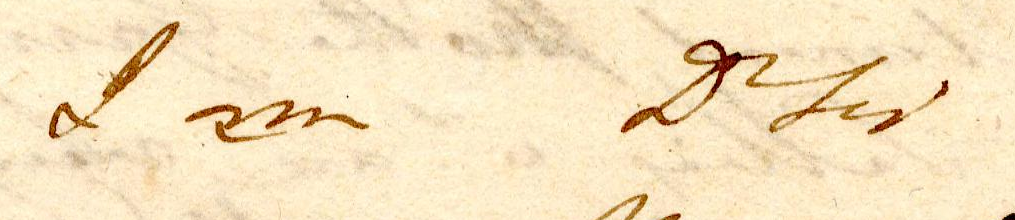I am D^r Sir
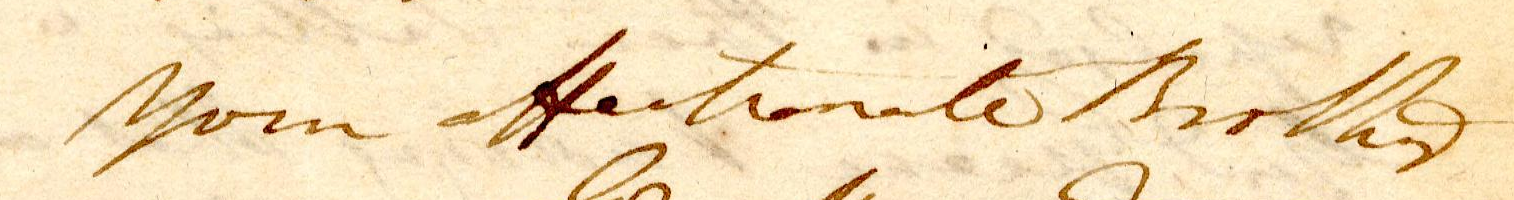Your affectionte Brother
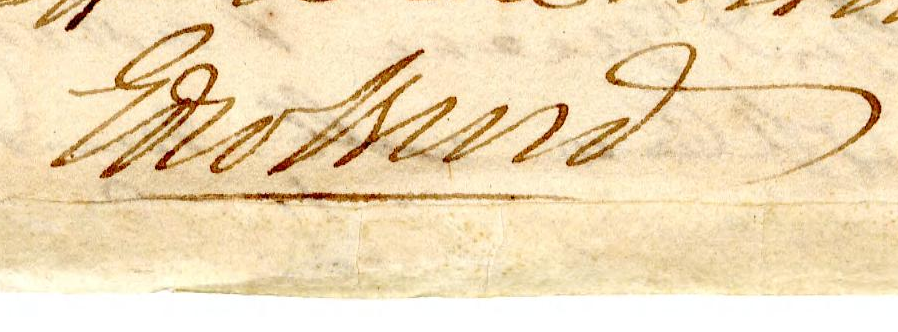Edw Burd
